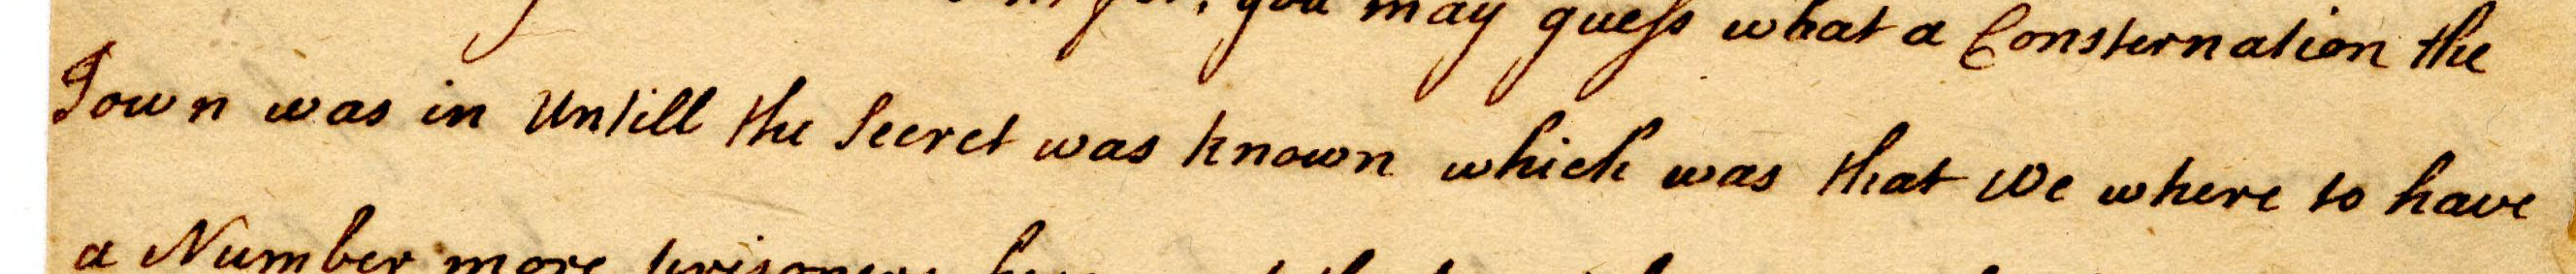Town was in untill the Secret was known which was that we where to have
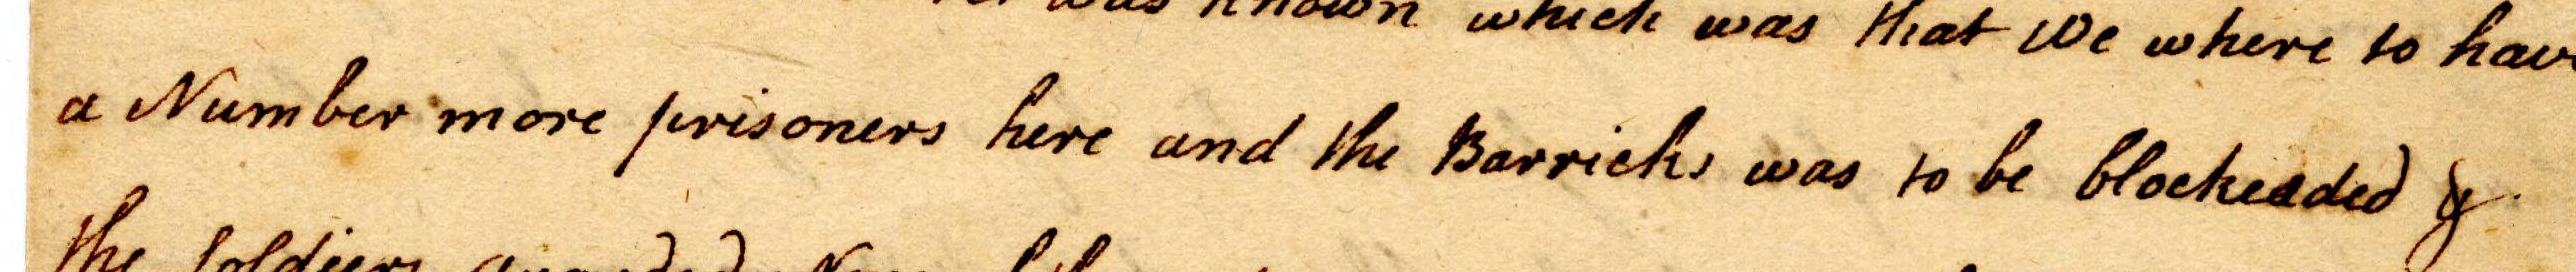a Number more prisoners here and the Barricks was to be blockeaded &
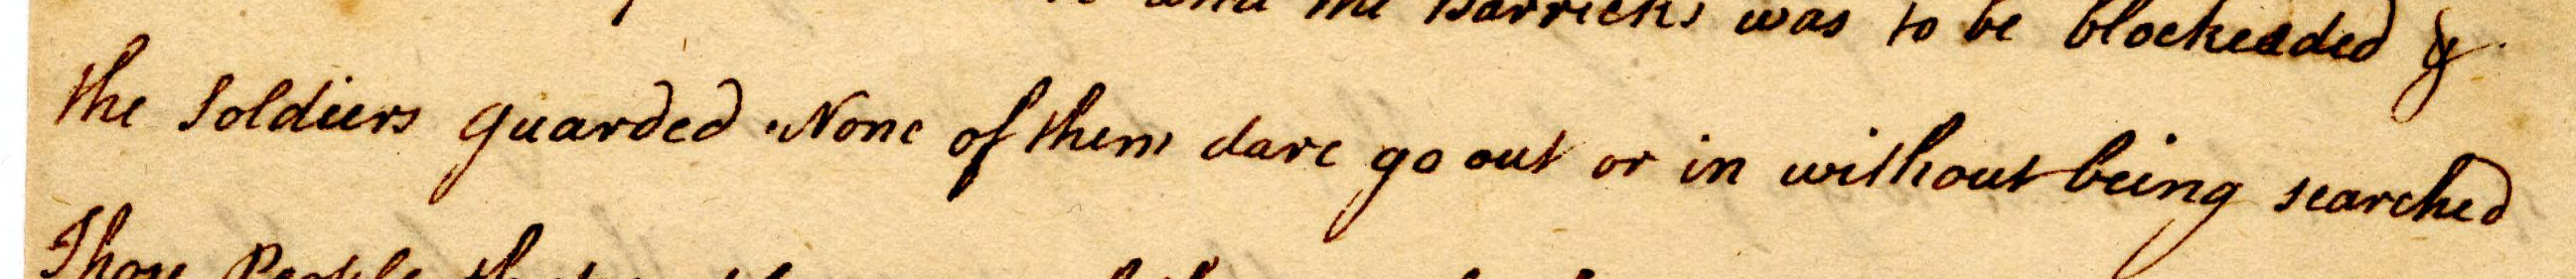the Soldiers guarded None of them dare go out or in without being searched
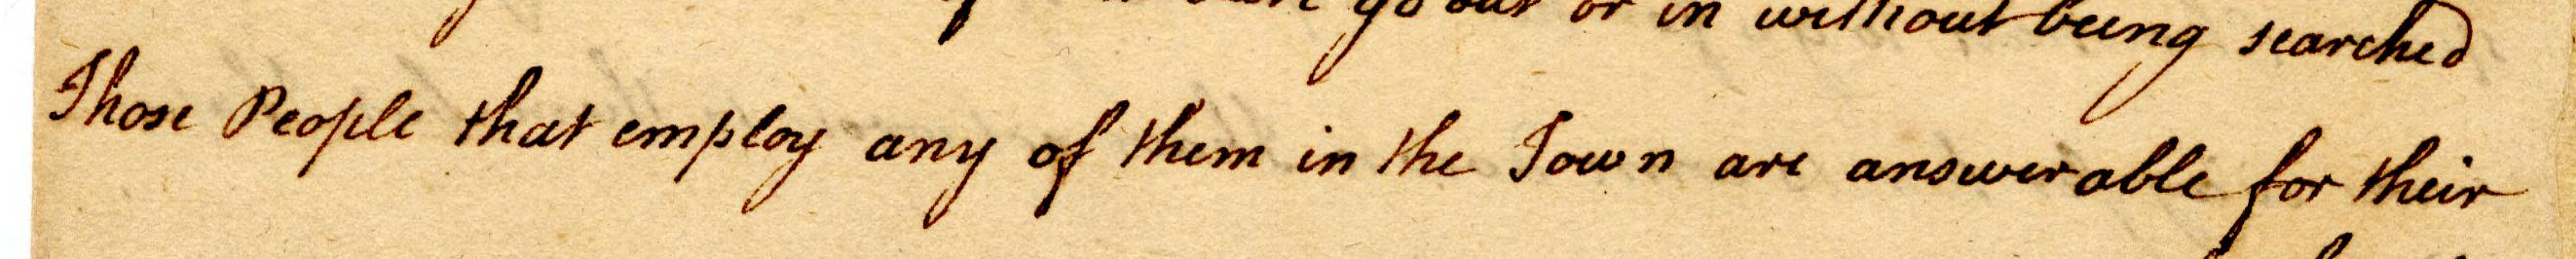Those People that employ any of them in the Town are answerable for their
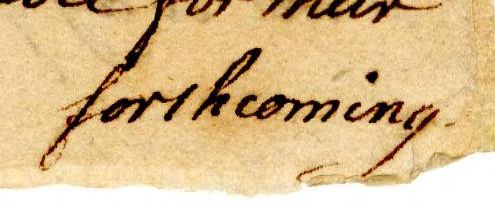forthcoming
